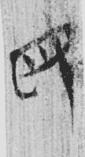母
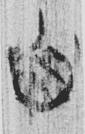自
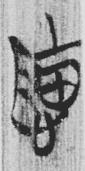○（惰）
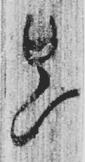也
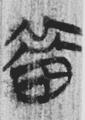昔
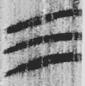三
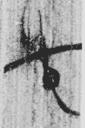弋（代）
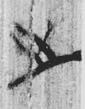之
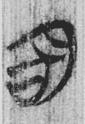明
